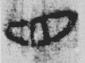四
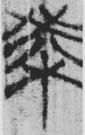楑（睽）
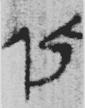○（孤）
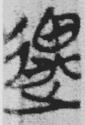遇
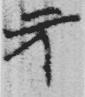元
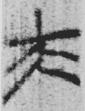夫
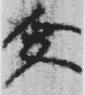交
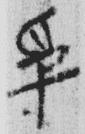孚
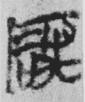礪
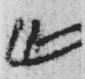亡
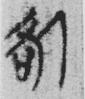咎
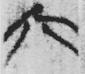六
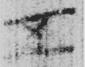五
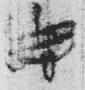悔
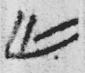亡
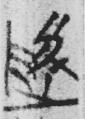○（陞）
